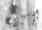㠯（以）
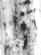取（娶）
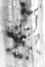妻
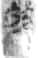祭
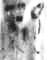祀
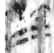竺（築）
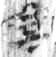室
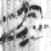立
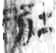社
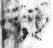禝（稷）
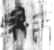○（帶）
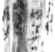鐱（劍）
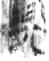○（冠）
